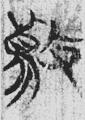○（沫）
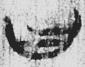曰
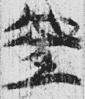○（吾）
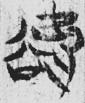欲
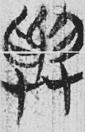與
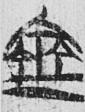齊
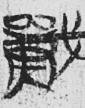戰
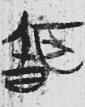䎽（問）
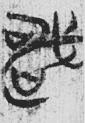○（陳）
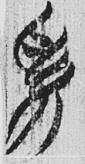奚
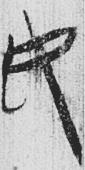女（如）
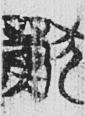○（守）
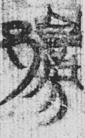○（邊）
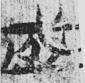城
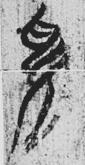奚
